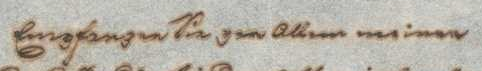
Empfangen Sie vor Allem meinen
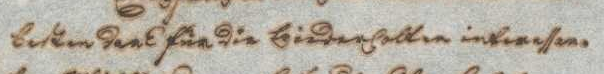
besten Dank für die wiederholten interessan-
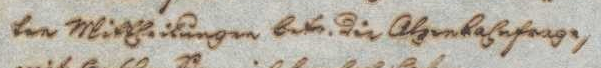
ten Mittheilungen betr. die Alpenbahnfrage,
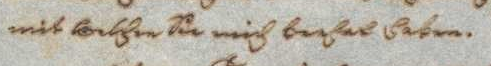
mit welchen Sie mich beehrt haben.
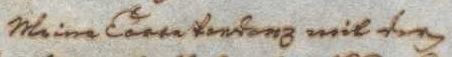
Meine Correspondenz mit der
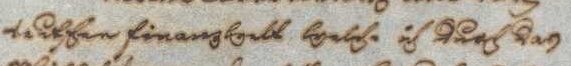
deutschen Finanzwelt welche ich durch das
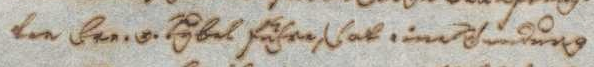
ten Hrn. v. Sybel führe, hat eine Wendung
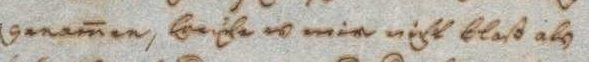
genommen, welche es mir nicht bloß als
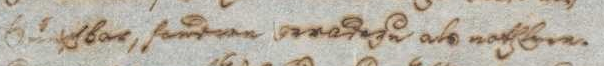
wünschbar, sondern geradezu als nothwen-
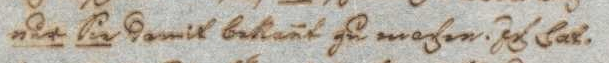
Sie damit bekannt zu machen. Ich hat-
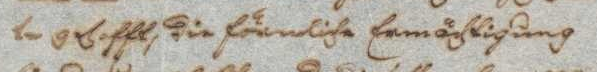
te gehofft, die förmliche Ermächtigung
